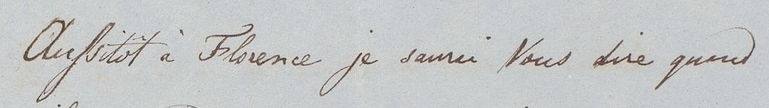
Aussitôt à Florence je saurai Vous dire quand
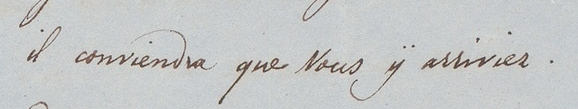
il conviendra que Vous y arriviez.
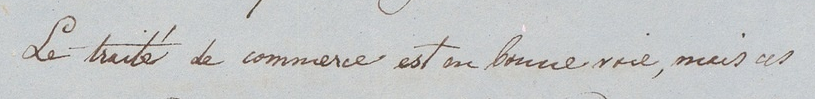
Le traité de commerce est en bonne voie, mais ces
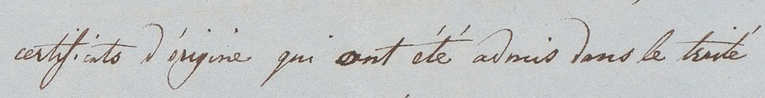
certificats d'origine qui ont été admis dans le traité
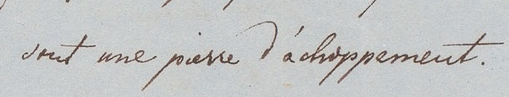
sont une pierre d'achoppement.
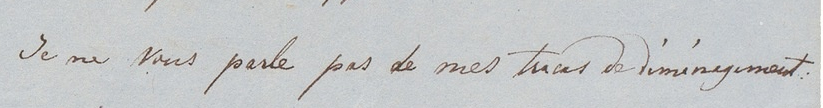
Je ne Vous parle pas de mes traces de déménagement:
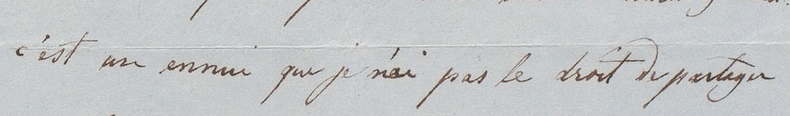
c'est un ennui que je n'ai pas le droit de partager
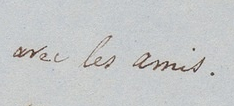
avec les amis.
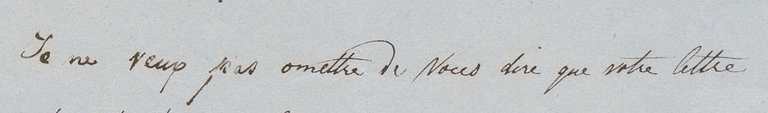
Je ne veux pas omettre de Vous dire que votre lettre
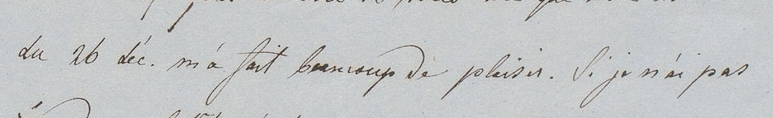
du 26 déc. m'a fait beaucoup de plaisir. Si je n'ai pas
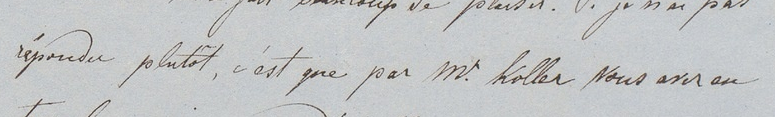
répondu plutôt, c'est que par MrKoller Vous avez eu
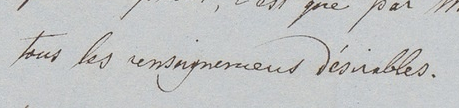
tous les renseignemens désirables.
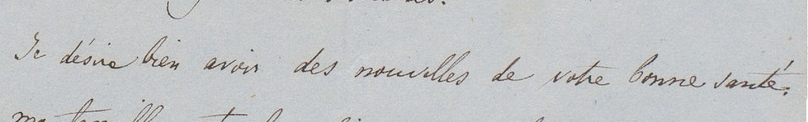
Je désire bien avoir des nouvelles de votre bonne santé,
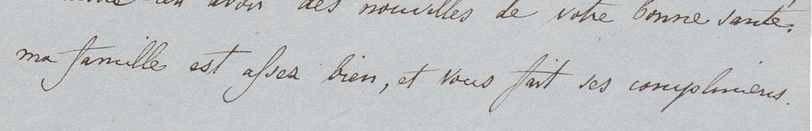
ma famille est assez bien, et Vous fait ses complimens.
